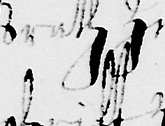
genehmigt.
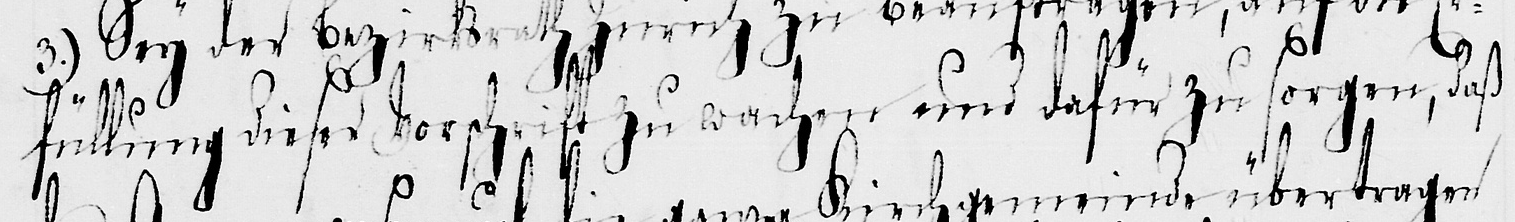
füllung dieser Vorschrift zu wachen und dafür zu sorgen, daß
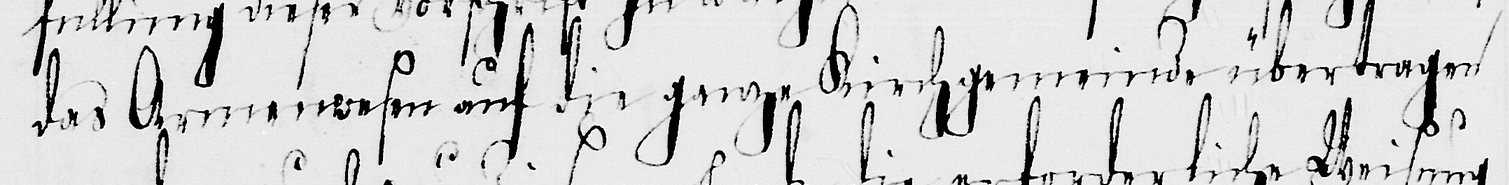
das Armenwesen auf die ganze Kirchgemeinde übertragen
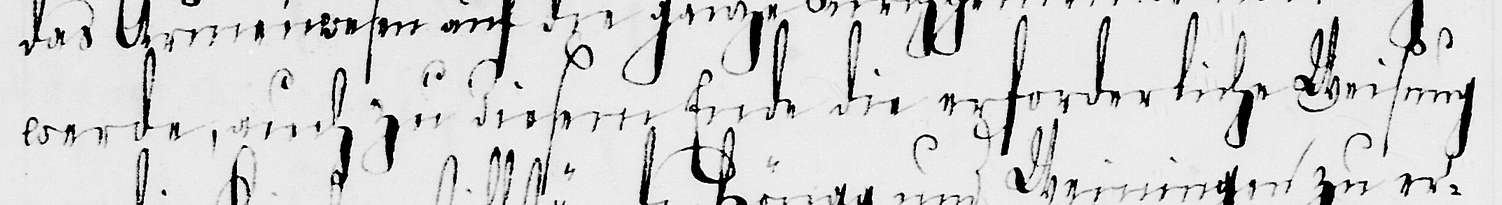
werde, auch zu diesem Ende die erforderliche Weisung
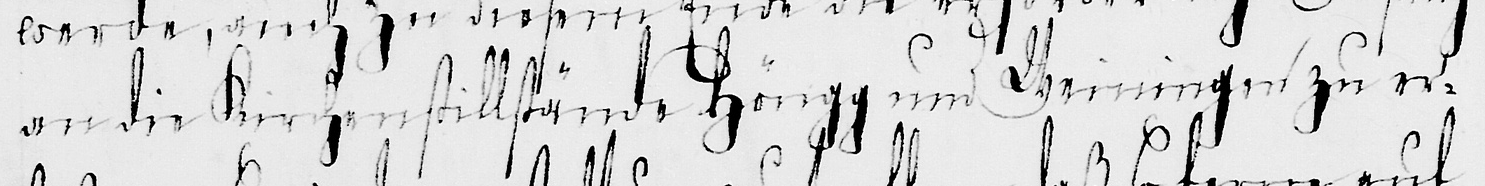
an die Kirchenstillstände Höngg und Weiningen zu er¬
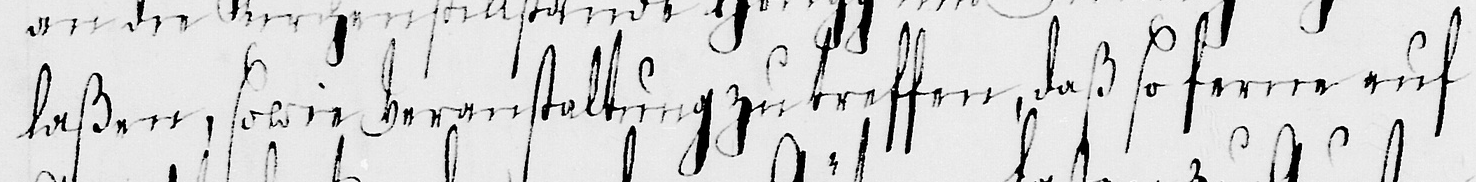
laßen, sowie Veranstaltung zu treffen, daß so ferne auf
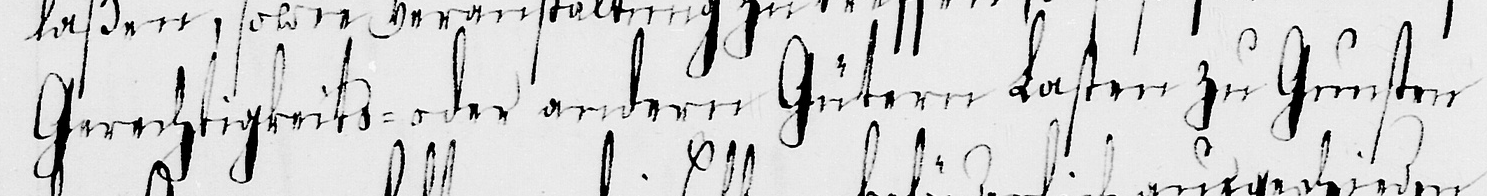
Gerechtigkeits- oder andern Gütern Lasten zu Gunsten
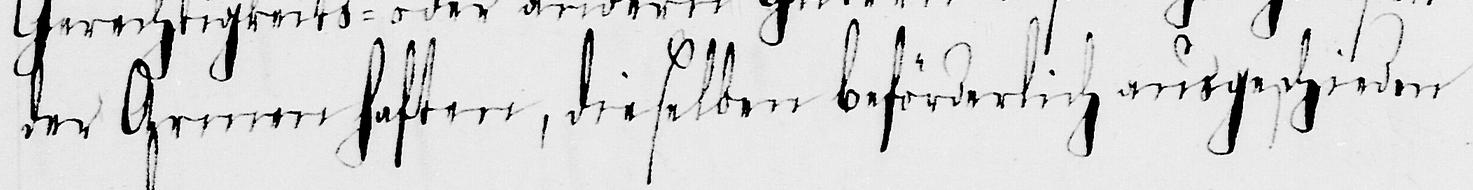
der Armen haften, dieselben beförderlich ausgeschieden
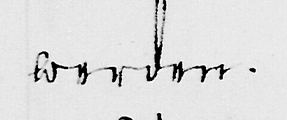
werden.
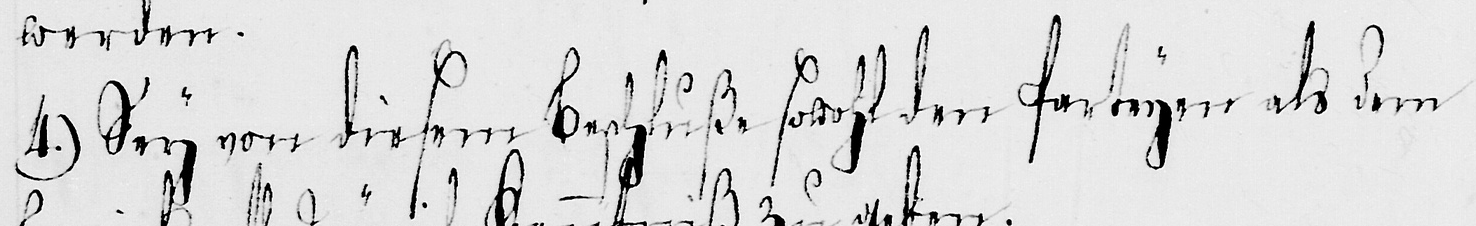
4.) Sey von diesem Beschluße sowohl den Parteyen als dem
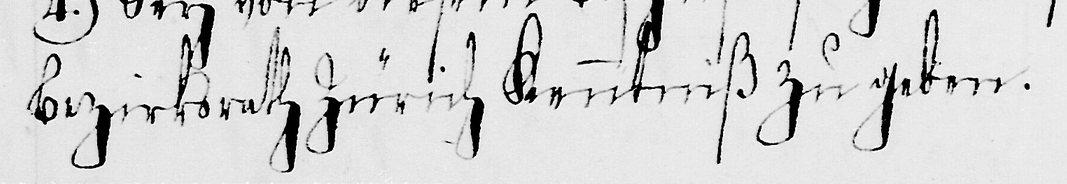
Bezirksrath Zürich Kenntniß zu geben.
